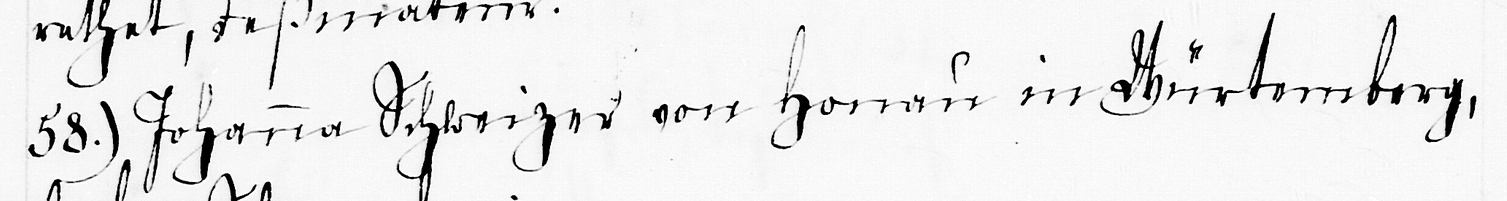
58.) Johanna Schweizer von Honau in Würtemberg,
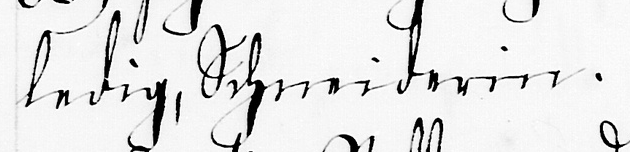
ledig, Schneiderin.
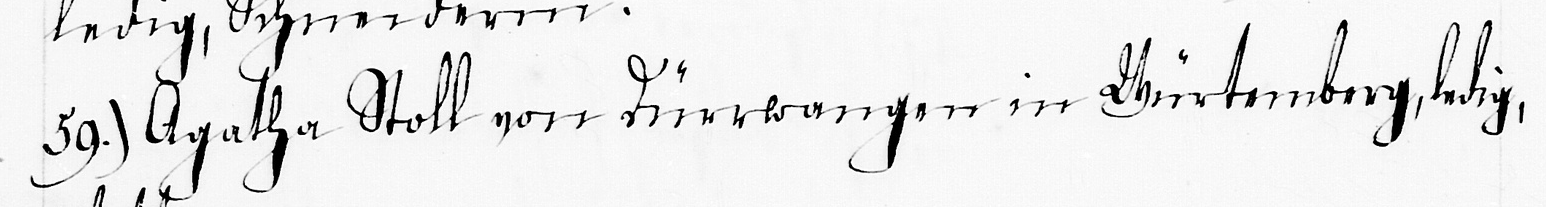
59.) Agatha Stoll von Dürrwangen in Würtemberg, ledig,
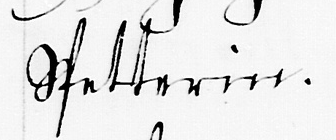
Spetterin.
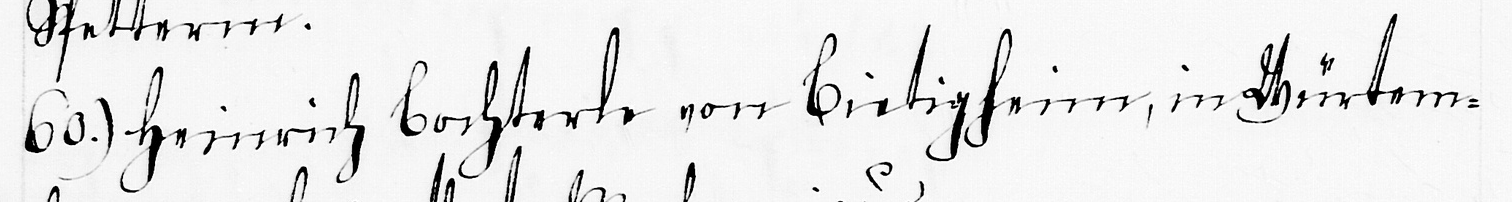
60.) Heinrich Bochterle von Bietigheim, in Würtem¬
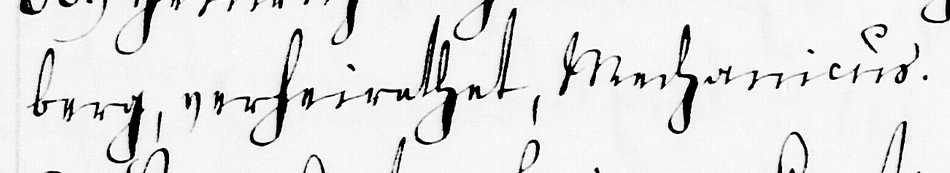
berg, verheirathet, Mechanicus.
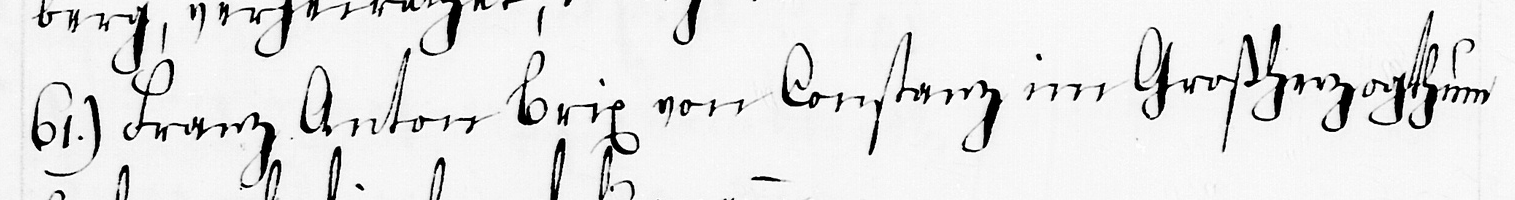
61.) Franz Anton Brix von Constanz im Großherzogthum
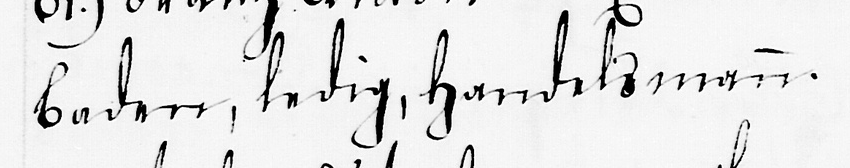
Baden, ledig, Handelsmann.
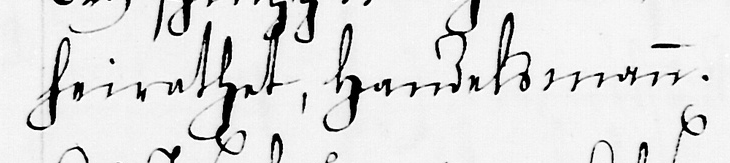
heirathet, Handelsmann.
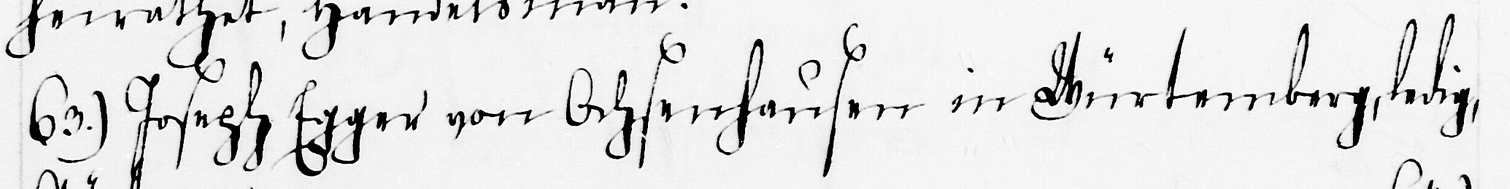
63.) Joseph Egger von Ochsenhausen in Würtemberg, ledig,
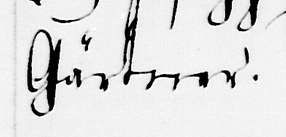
Gärtner.
